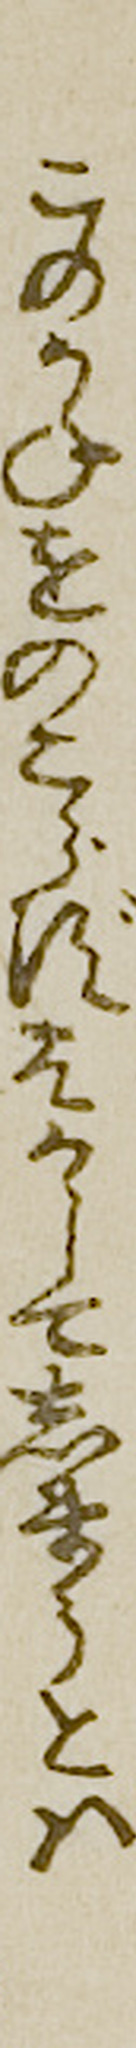このかねをのこらずはかしてしまうとは
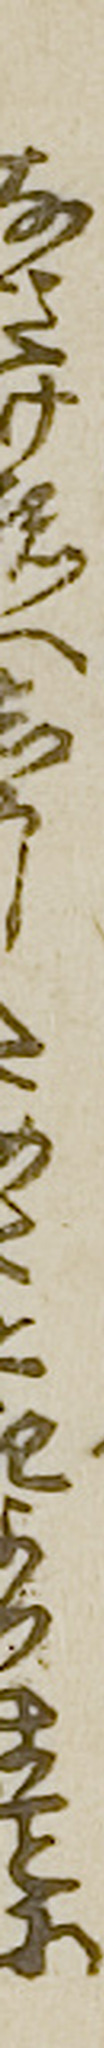なさけねへしかしためたときよりまことに
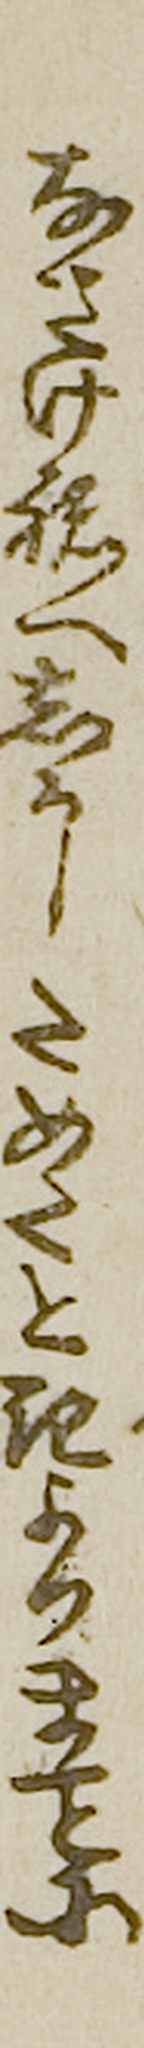なさけねへしかしためたときよりまことに
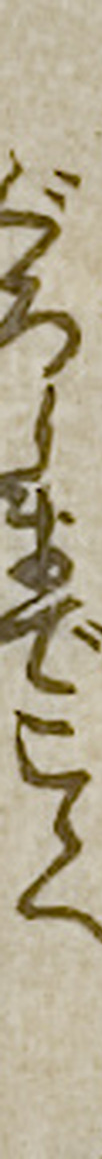ぐろ？までこゝへ
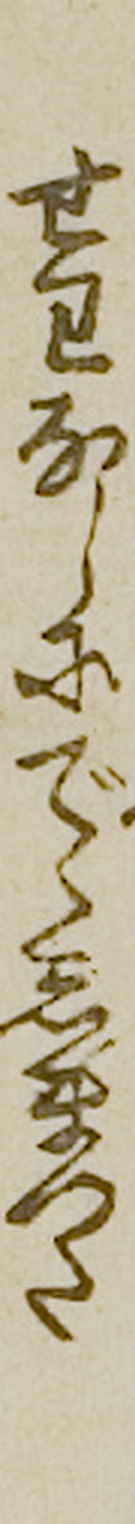せわなしにでゝしまつた
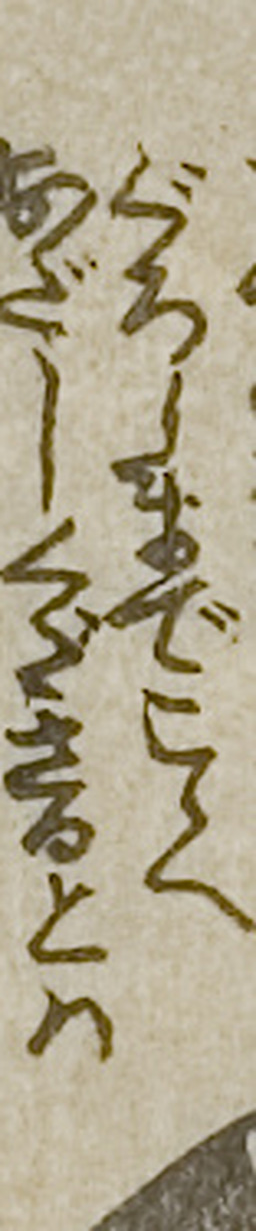おだしくださるとは
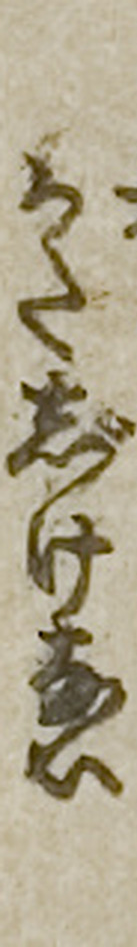かたじけない
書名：[鯰に金銀を吐かされる持丸]
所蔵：東京大学総合図書館 General Library in the University of Tokyo, JAPAN
